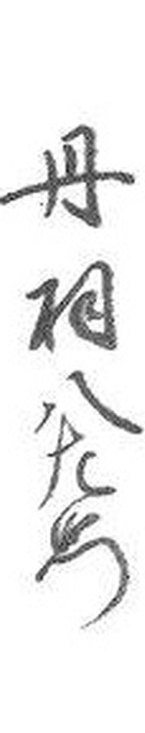丹羽八左衛門
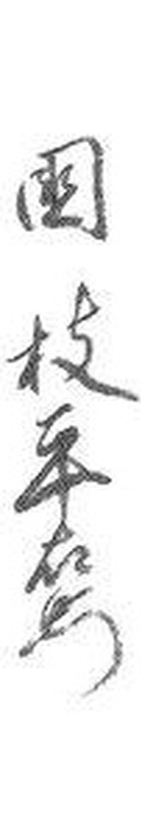国枝平右衛門
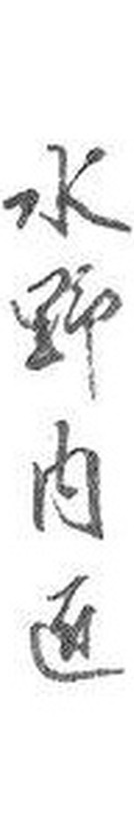水野内匠
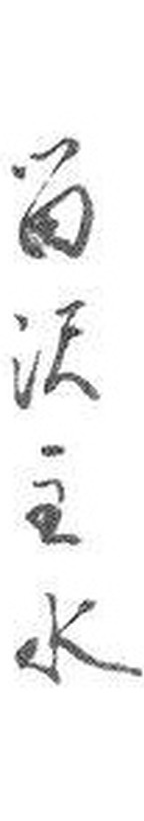留沢主水
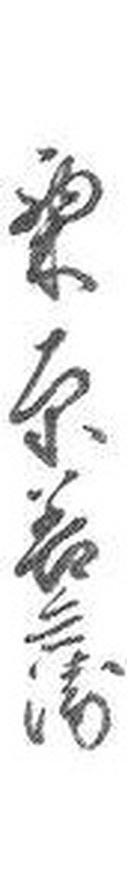栗原善兵衛
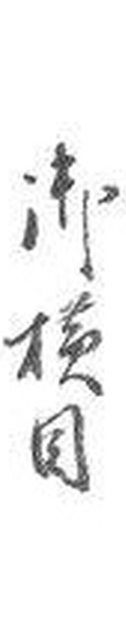御横目
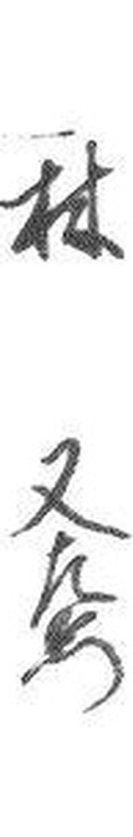林又左衛門
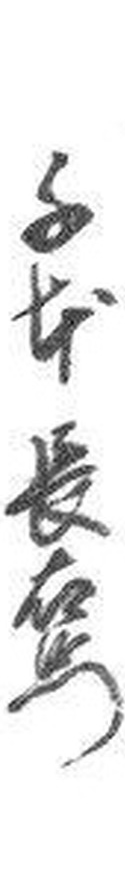千本長右衛門
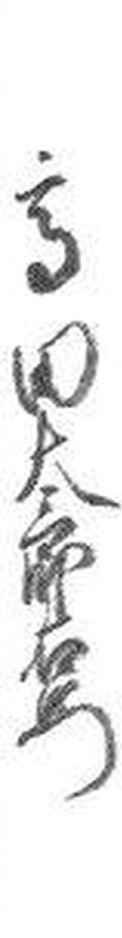高田太郎右衛門
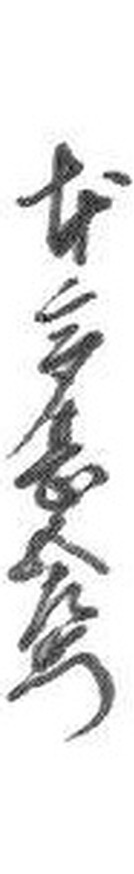本多甚五左衛門
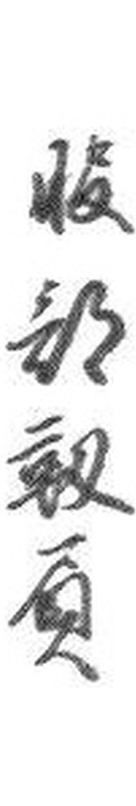服部靱負
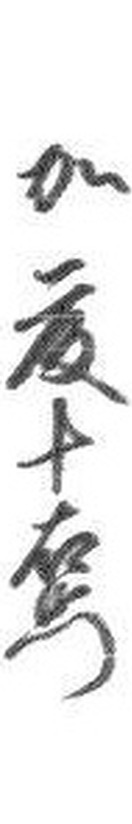加藤十右衛門
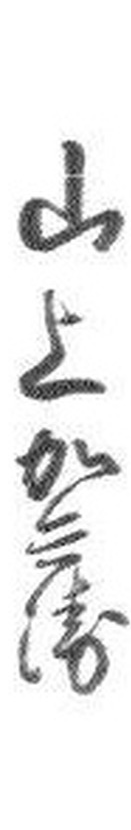山上加兵衛
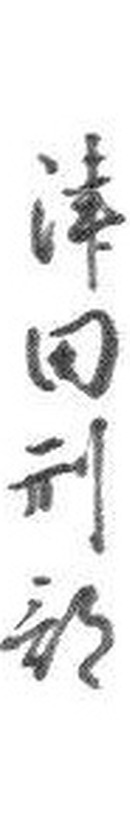津田刑部
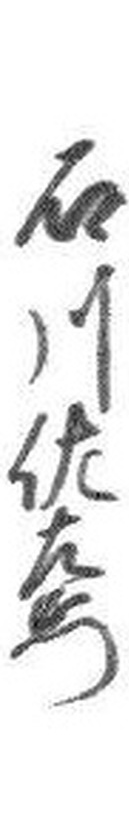石川佐左衛門
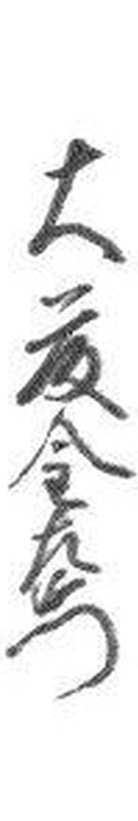大藤金左衛門
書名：家譜 四 忠昌公 従寛永七年到正保四年
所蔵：福井県文書館 Fukui Prefectural Archives
